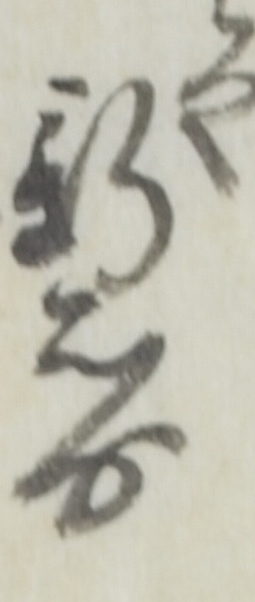新右衛門
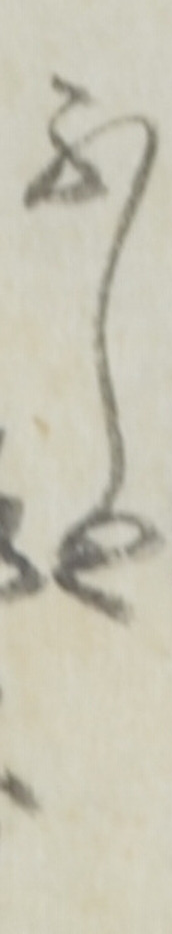ふしや
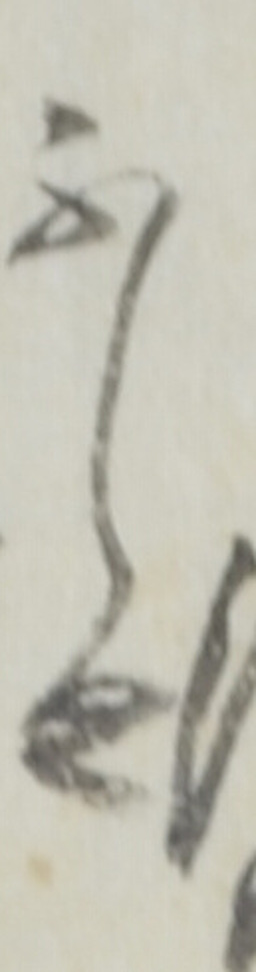ふしや
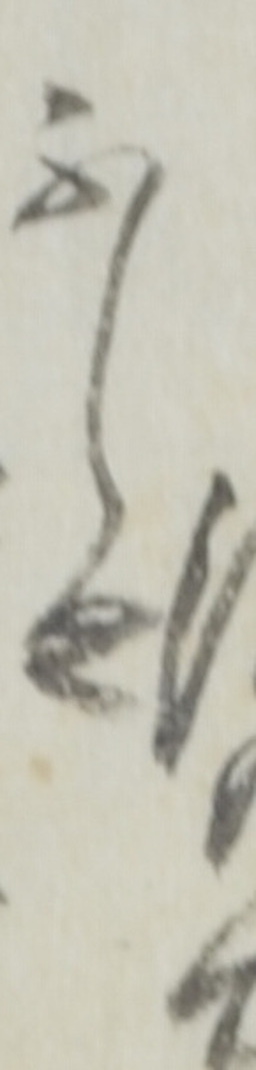ふしや
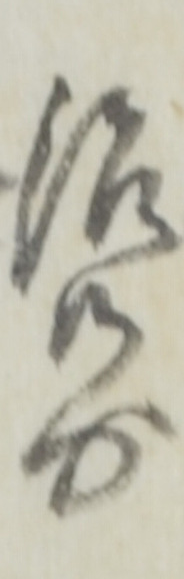閑兵衛
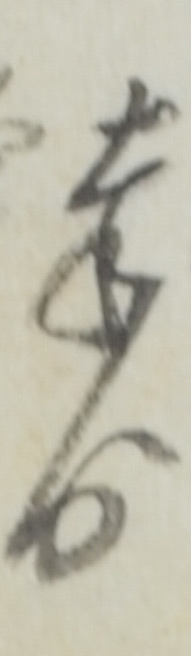民右衛門

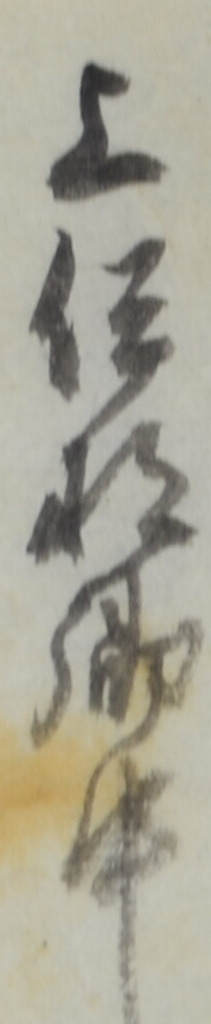上伊那郷中
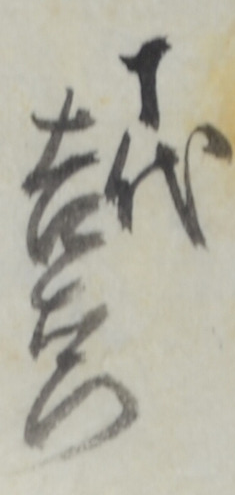吉右衛門
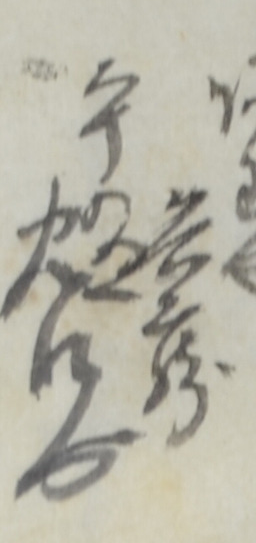忠左衛門
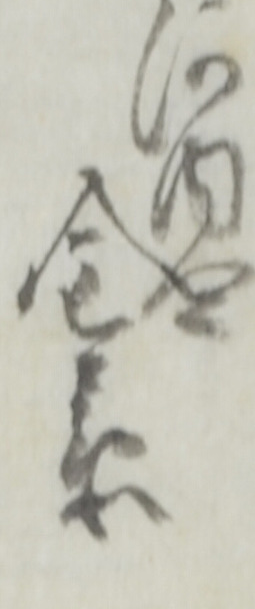金兵衛
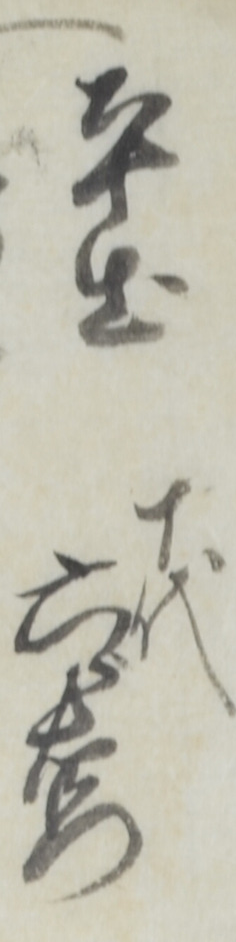辰野六郎右衛門
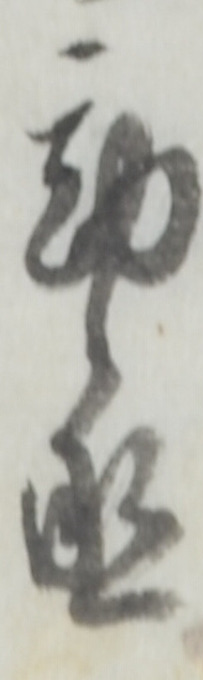勘之丞
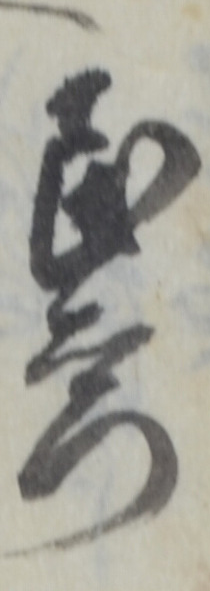吉右衛門
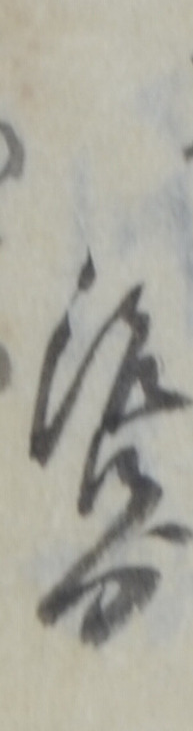忠左衛門

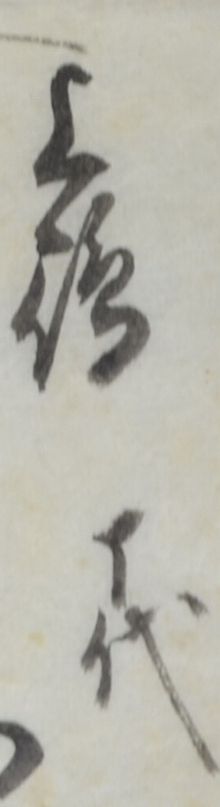上嶋丁代
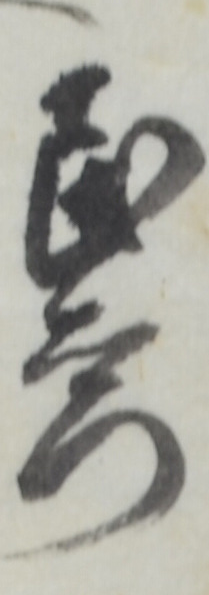常右衛門
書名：勧化人割帳
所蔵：伊那市立高遠町図書館・合同会社AMANE
